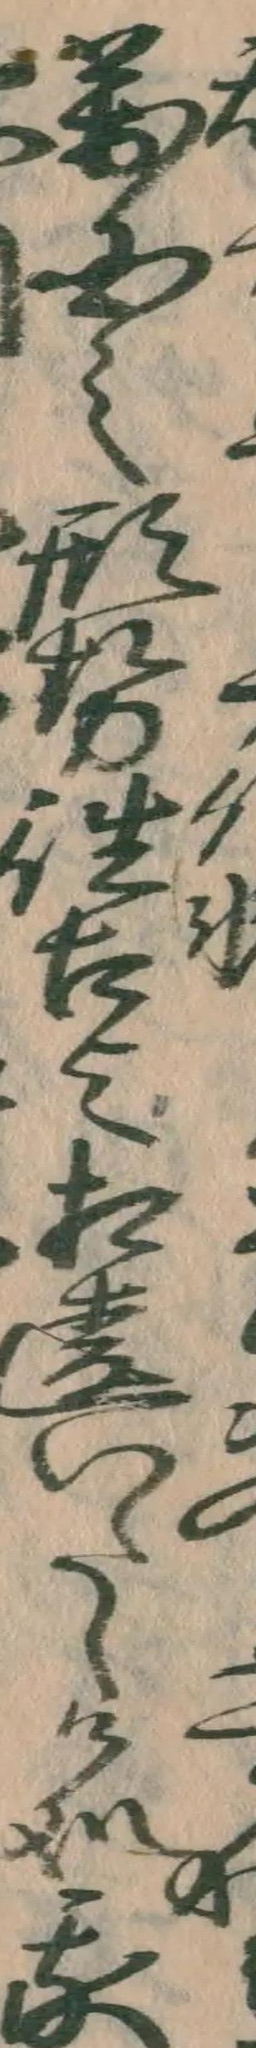一萬国之形勢往古と相違いたし候処我
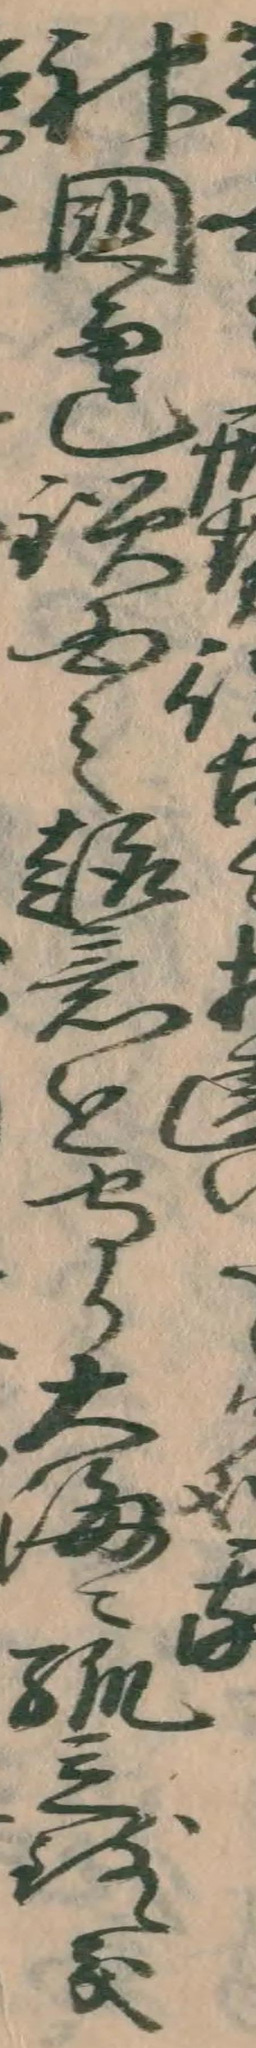神国而已鎖国之趣意を守り大海ニ孤立致候義
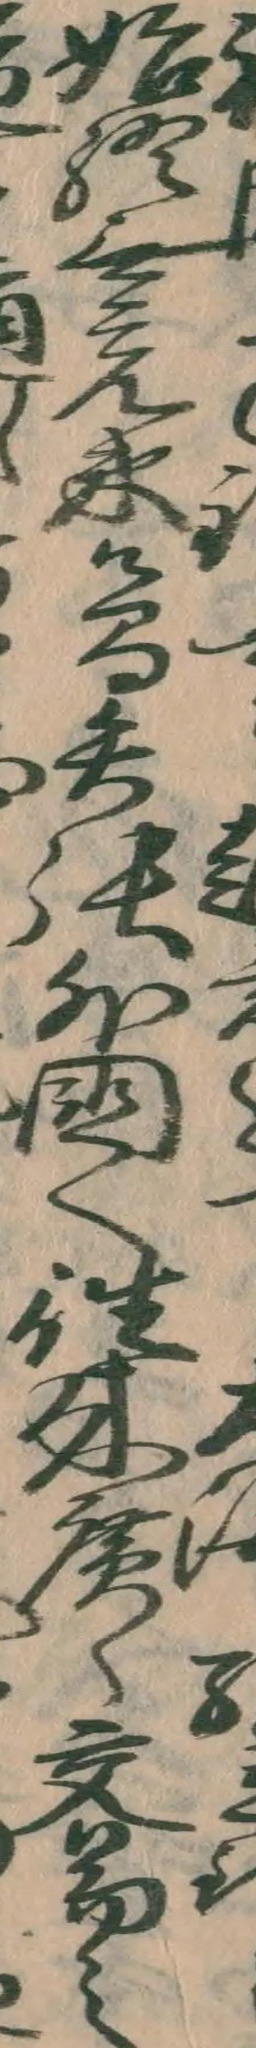始終無覚束候間矢張外国へ往来廣く交易之
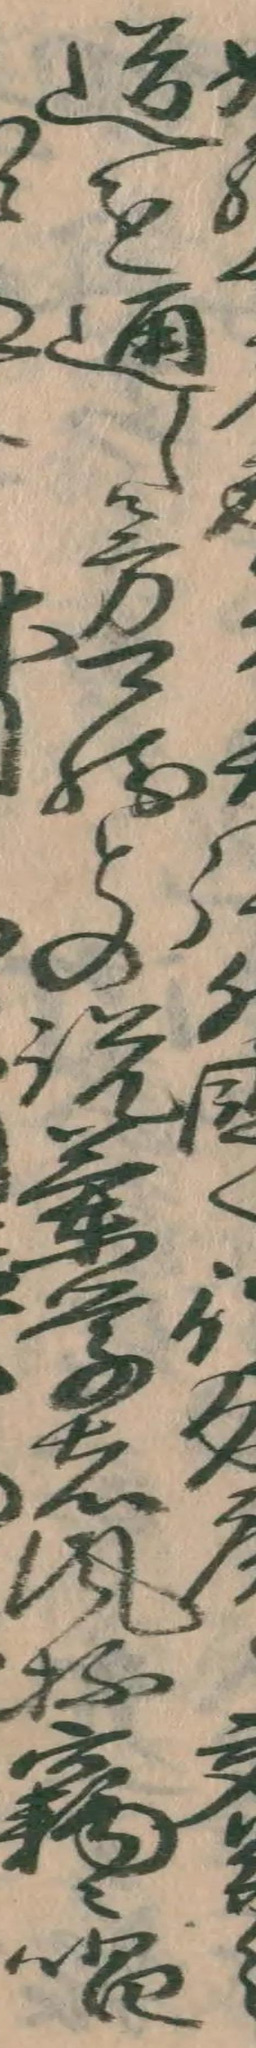道を通し候方可然との説蘭学者風抔竊ニ唱
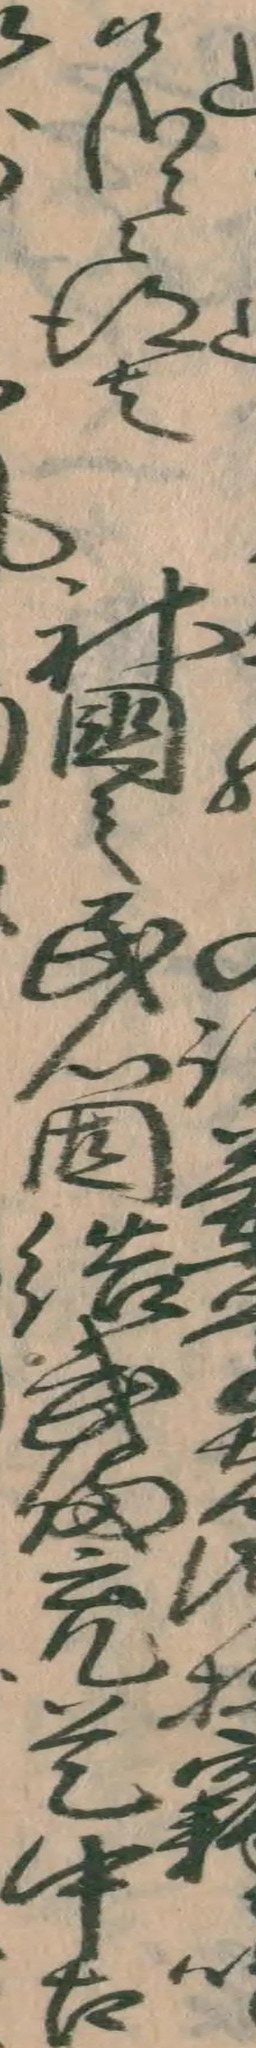候哉ニ候得者神国之民心固結武備充是中古
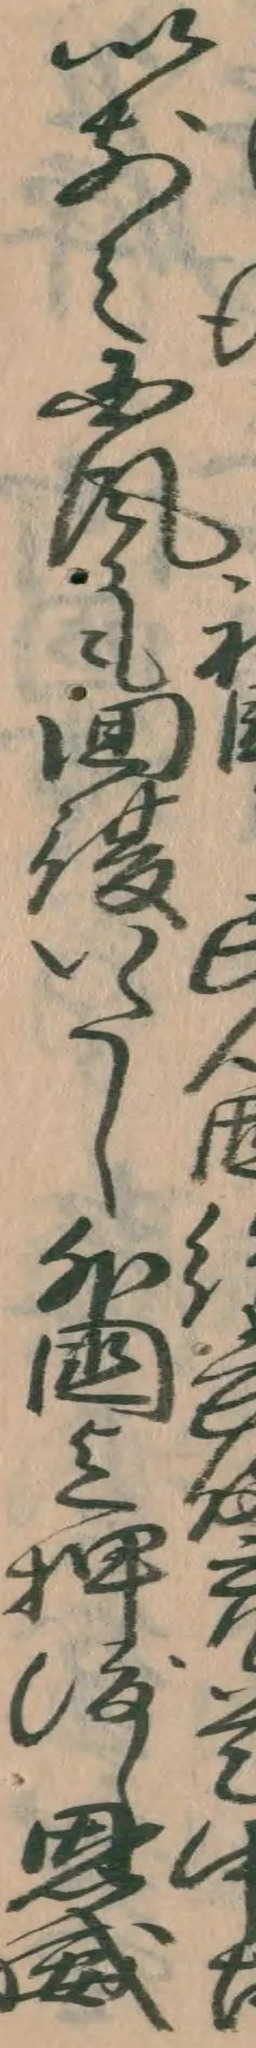以前之国風にも回復いたし外国迄押渡し恩威
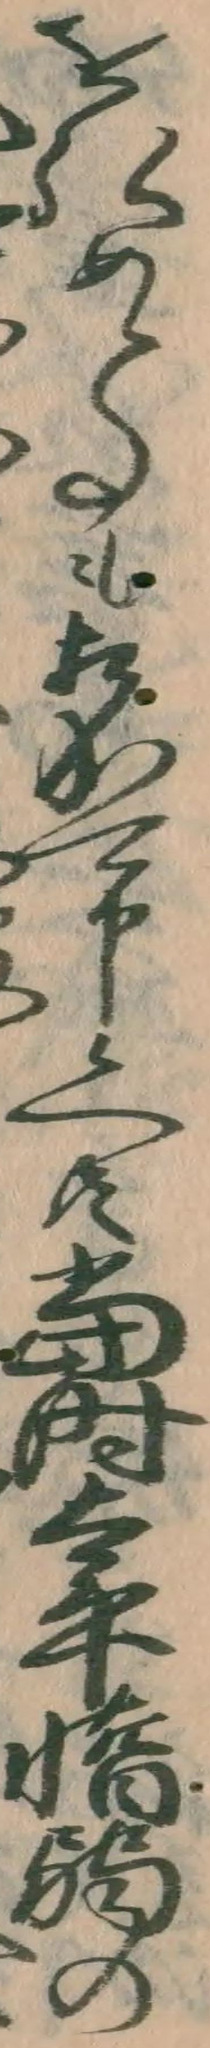を弘め候事も相成可申候へ共當時太平惰弱の
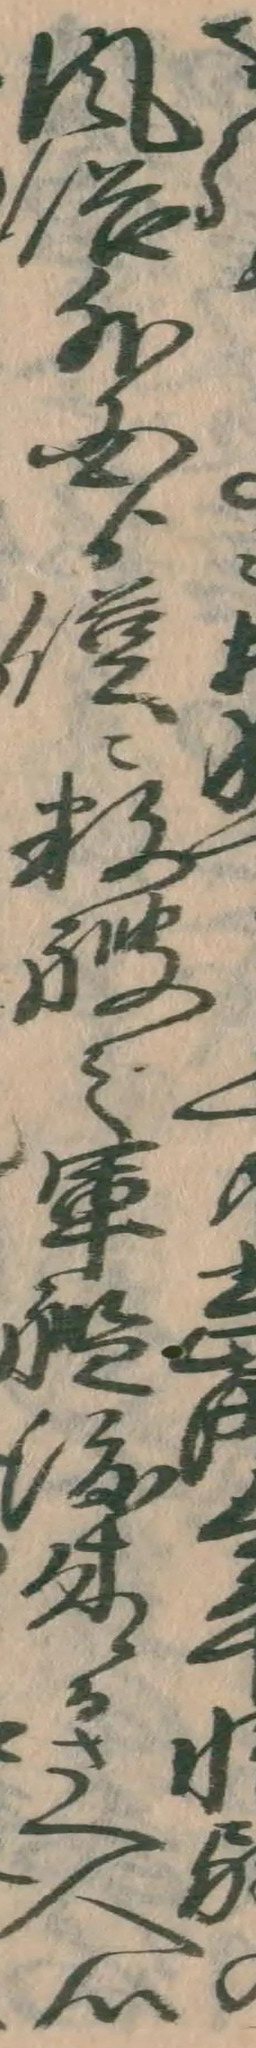風俗外国ゟ僅ニ数艘之軍艦渡来二而さへ人心
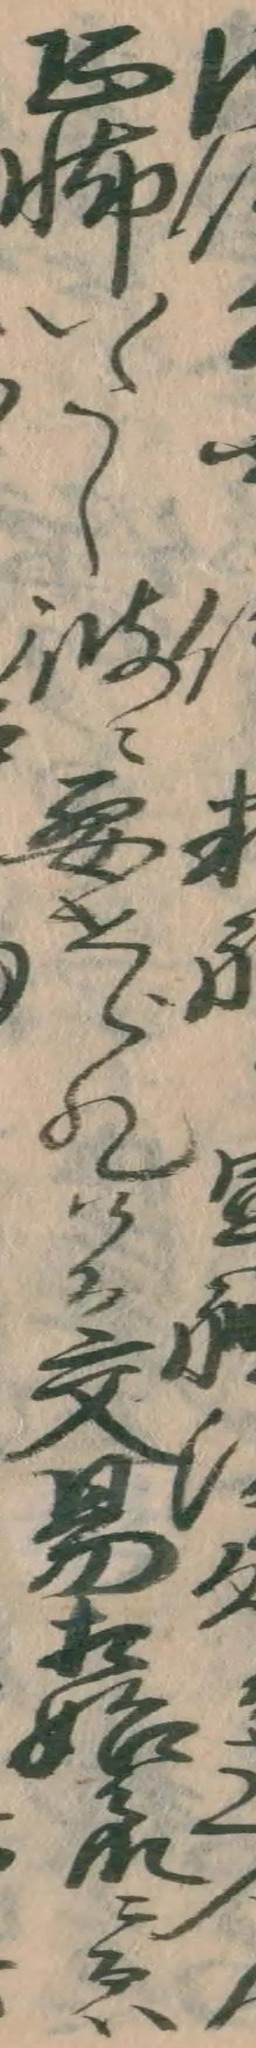恐怖いたし彼ニ要せられ候而交易相始候様二而ハ
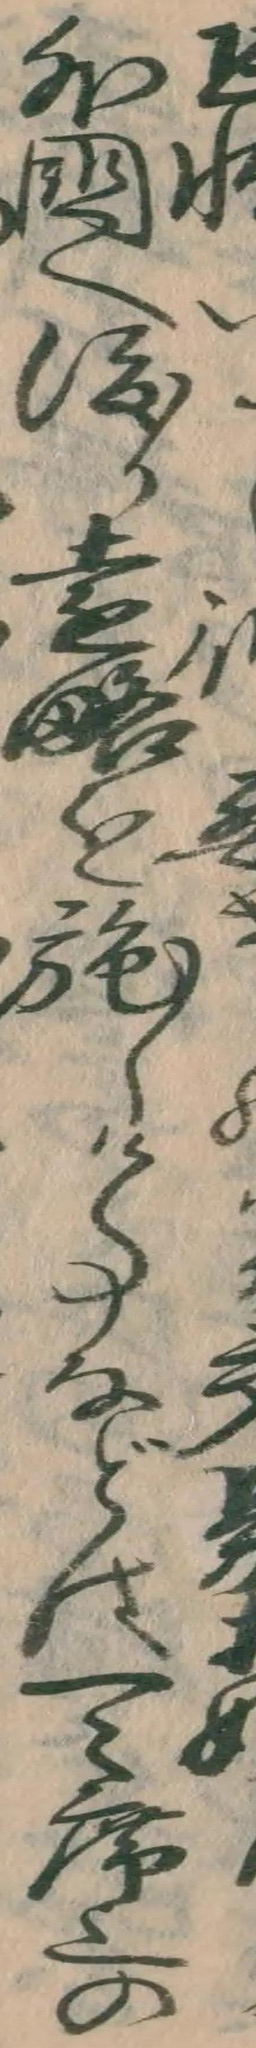外国へ渡り遠略を施し候事などは一々席上の
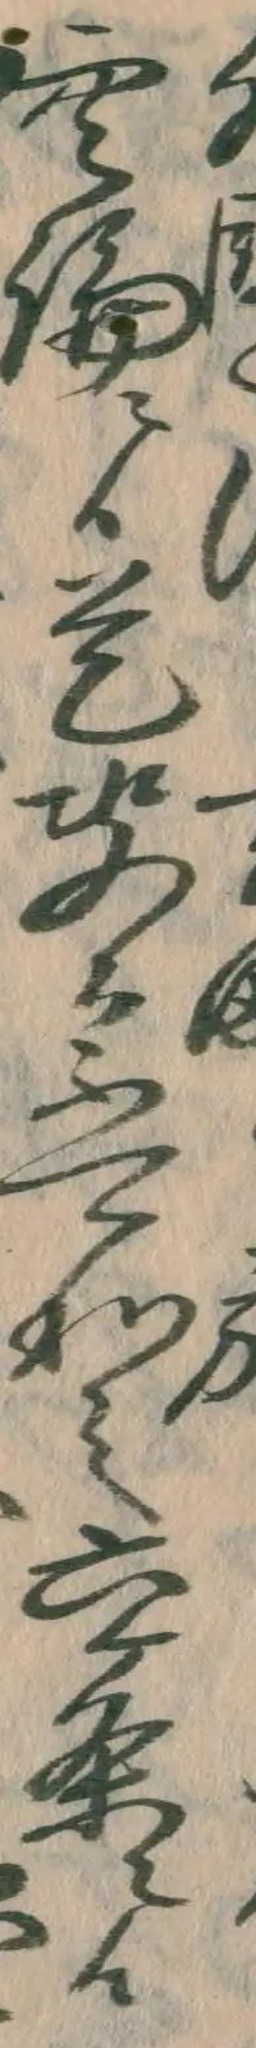空論ニ候是決而不可和之六ケ条ニ候
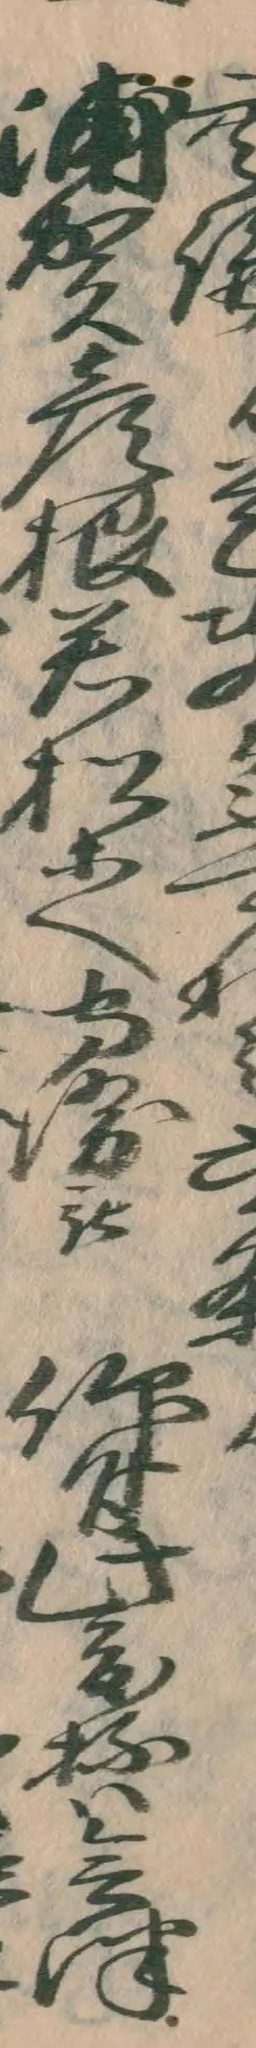一浦賀彦根若松等へ守衛被仰付此度抔ハ会津
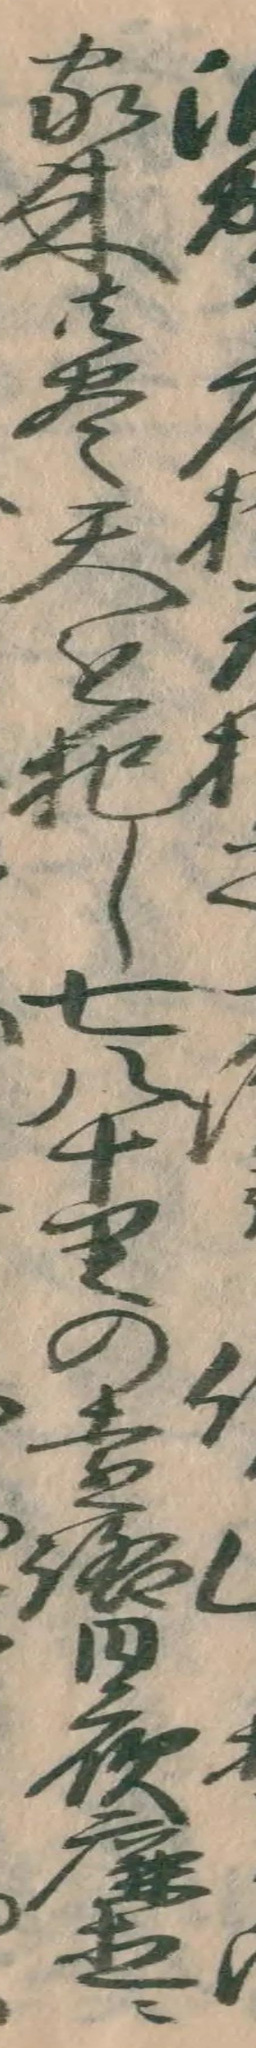家来共炎天を犯し七八十里の遠路日夜廉直ニ
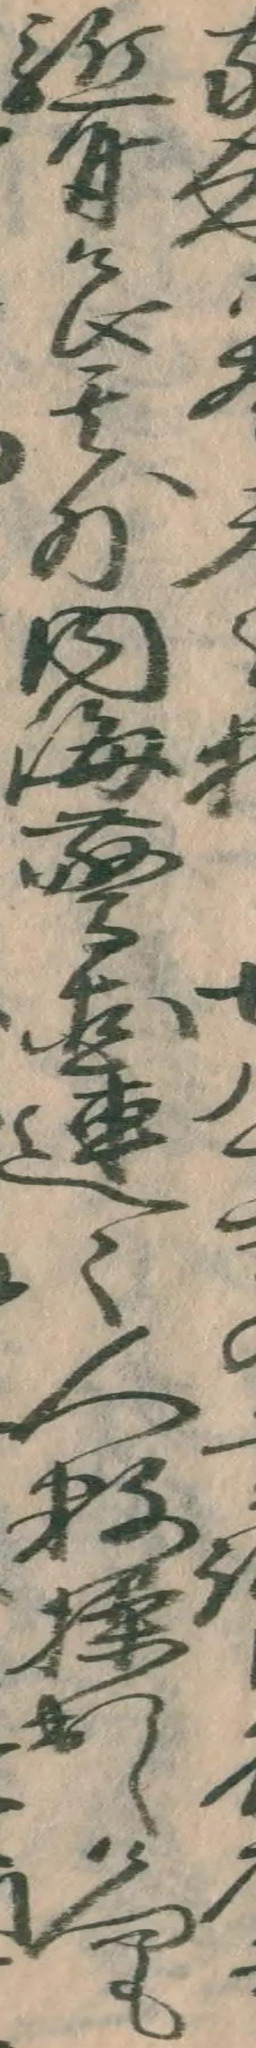駈付候由其外内海警固連々人数繰出し候向も
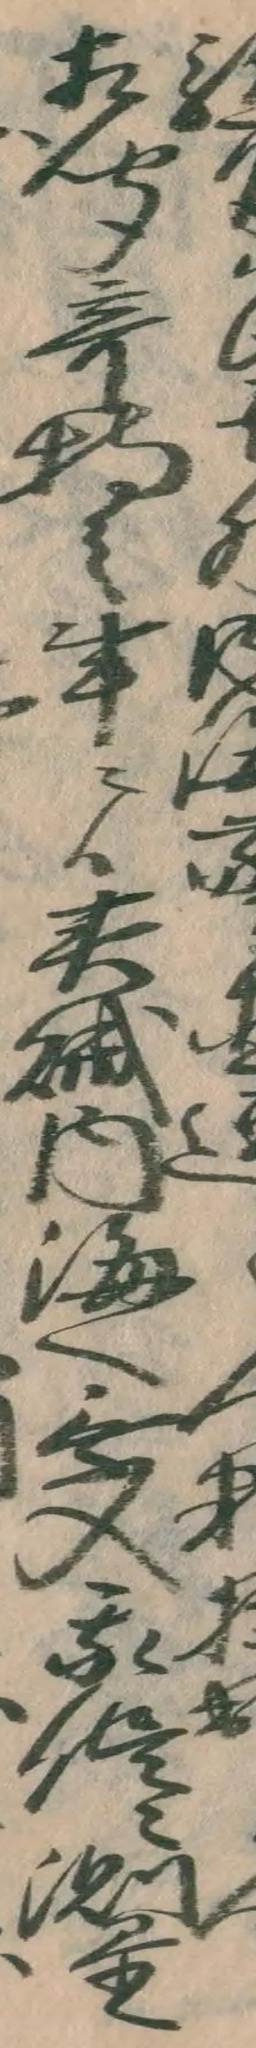相聞奇特之事ニ候夷賊内海へ乗入我儘ニ測量
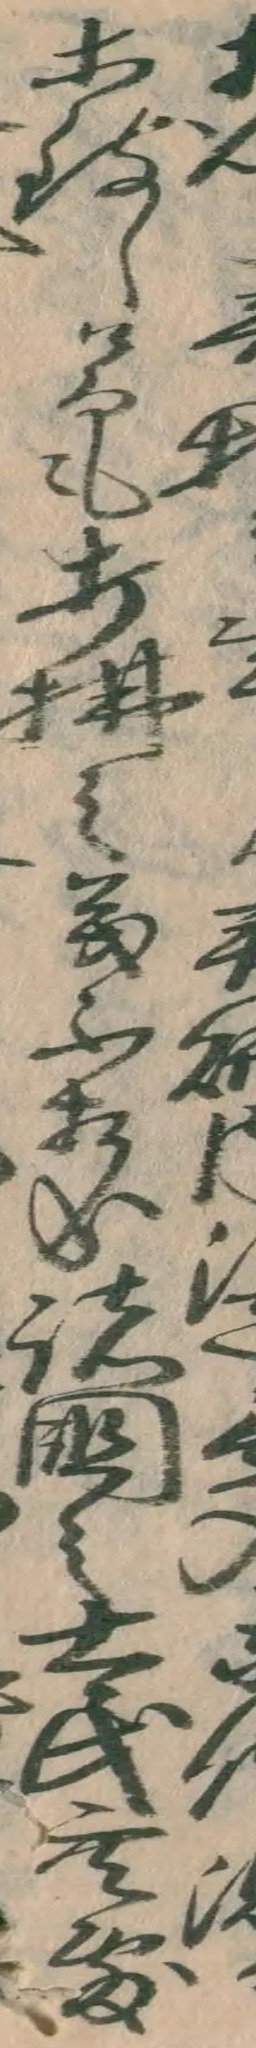等致し候而も打拂之義不相成諸国之士民空敷
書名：麗斎叢書. 20
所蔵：国立国会図書館 National Diet Library, JAPAN
